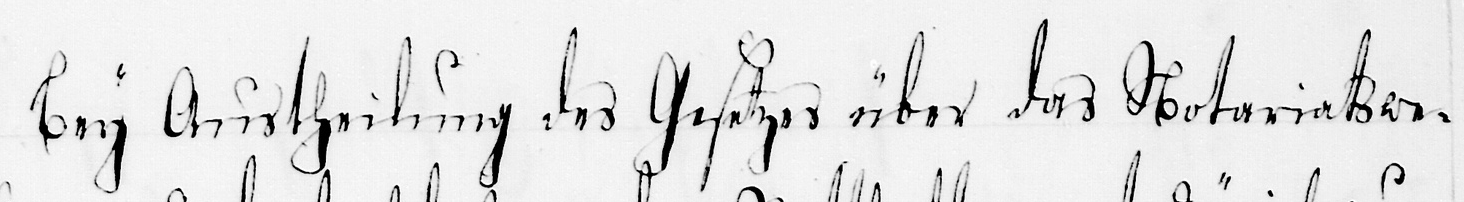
Bey Austheilung des Gesetzes über das Notariatswe¬
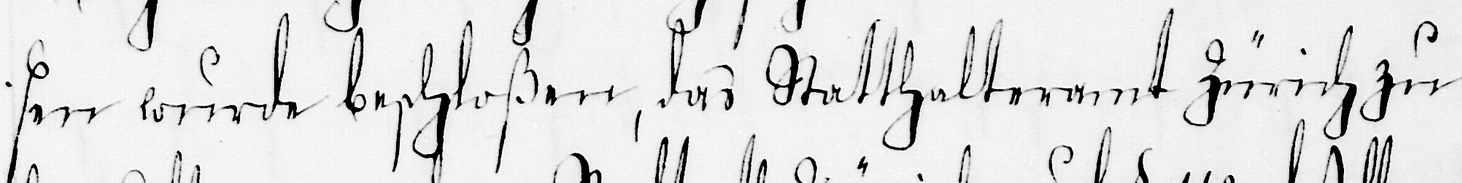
sen wurde beschloßen, das Statthalteramt Zürich zu
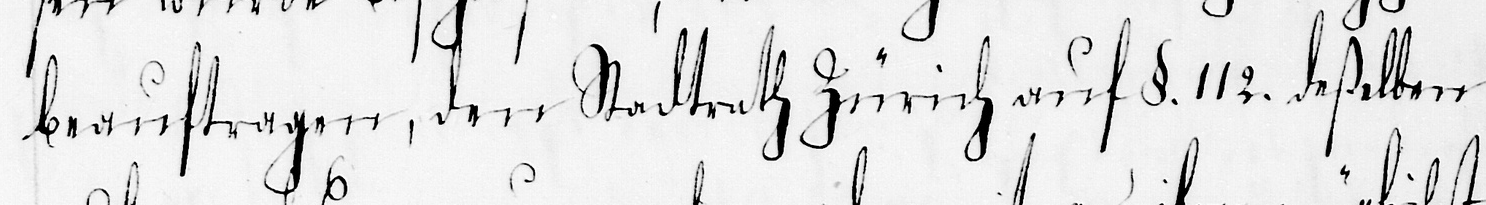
beauftragen, den Stadtrath Zürich auf §. 112. deßelben
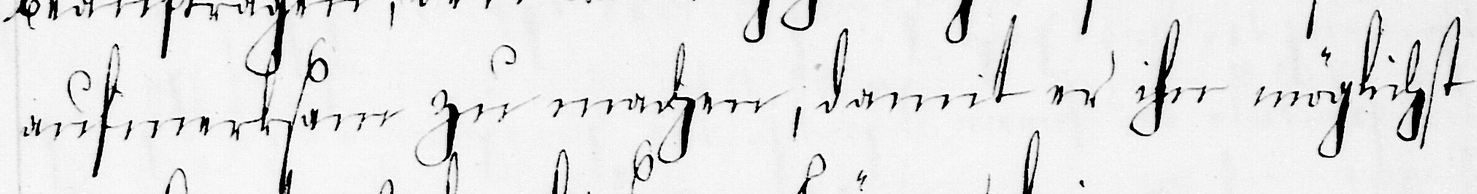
aufmerksam zu machen, damit er ihn möglichst
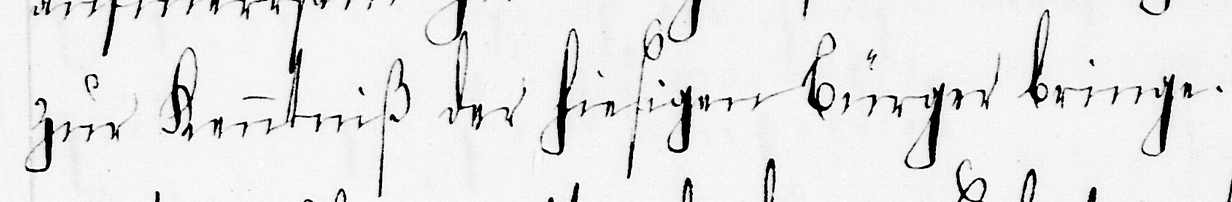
zur Kenntniß der hiesigen Bürger bringe.
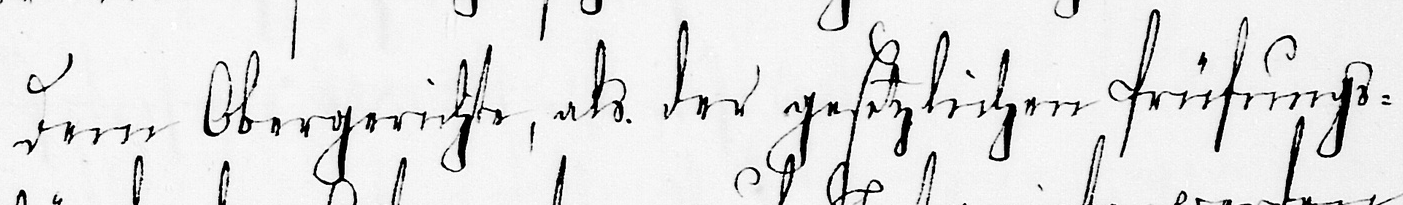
Dem Obergerichte, als der gesetzlichen Prüfungs¬
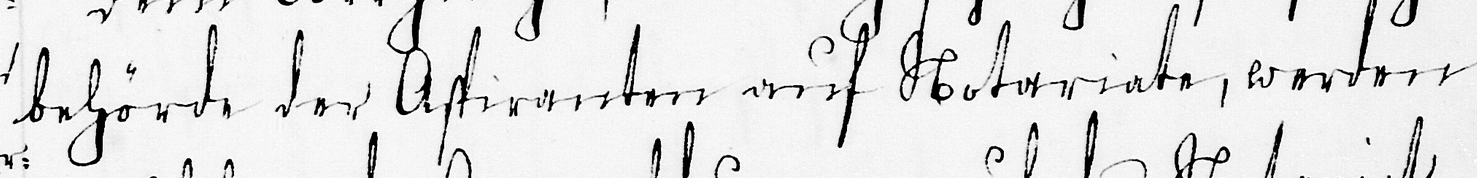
behörde der Aspiranten auf Notariate, werden
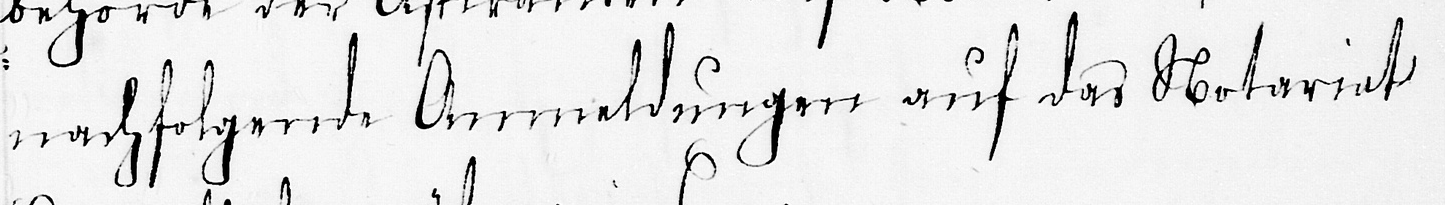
nachfolgende Anmeldungen auf das Notariat
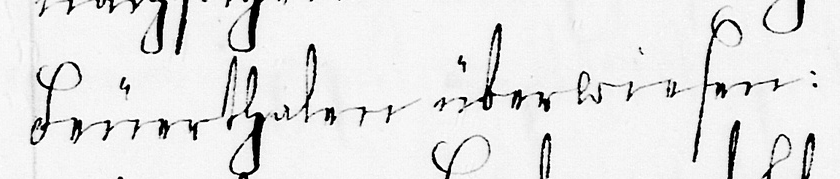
Feuerthalen überwiesen:
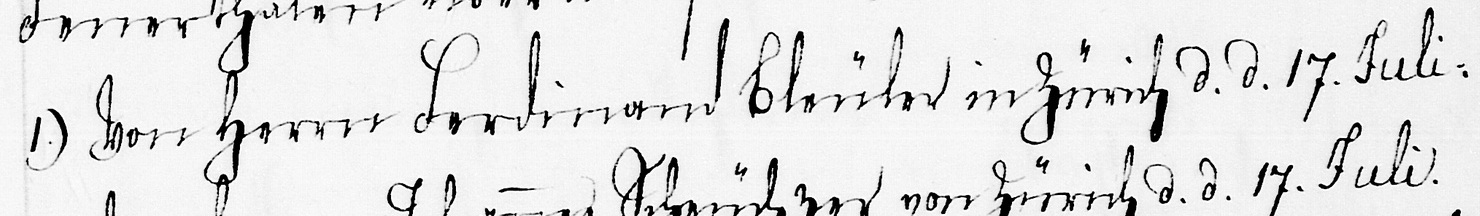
1.) Von Herrn Ferdinand Bleuler in Zürich d. d. 17. Juli.
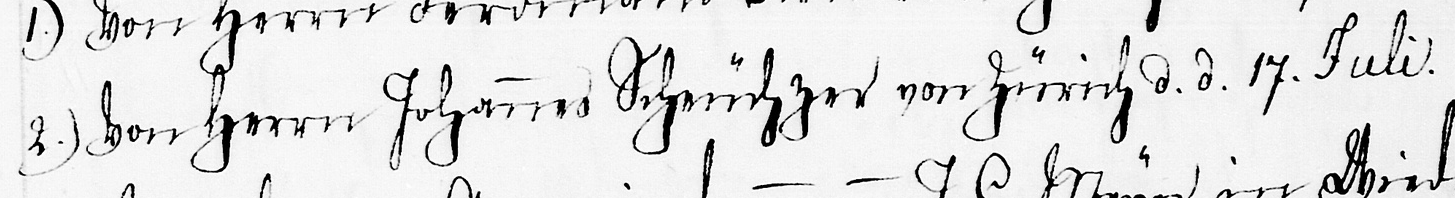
2.) Von Herrn Johannes Scheuchzer von Zürich d. d. 17. Juli.
